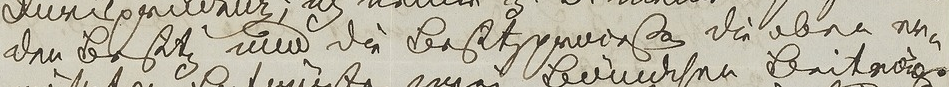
den Besitz und die Besitzproceße, die oben er-
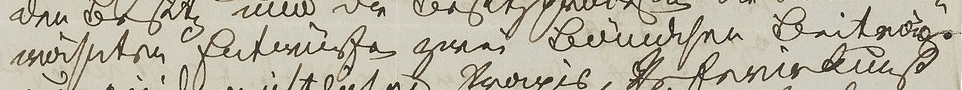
wähnten Entwürfe, zwei Bändchen Beiträge
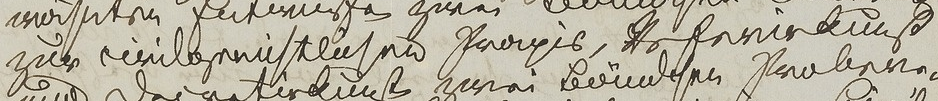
zur civilgerichtlichen Praxis, Referirkunst
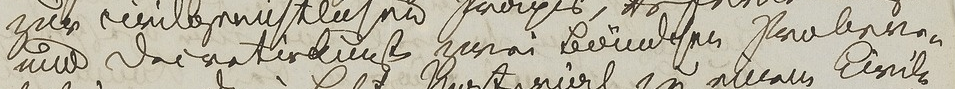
und Decretirkunst, zwei Bändchen Probere-
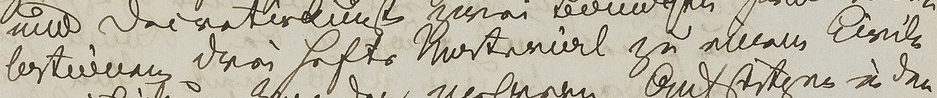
lationen, drei Hefte Material zu einem Civil-
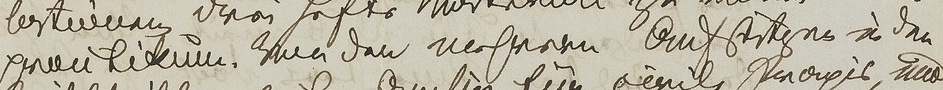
practikum. Von den mehrern Aufsätzen in den
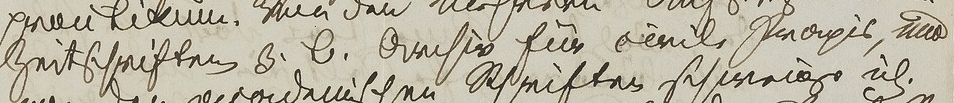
Zeitschriften, z. B. Archiv für civile Praxis, und
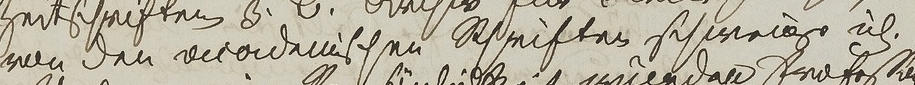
von den academischen Schriften schweige ich.
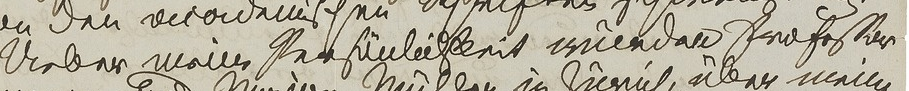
Ueber meine Persönlichkeit würden Professor
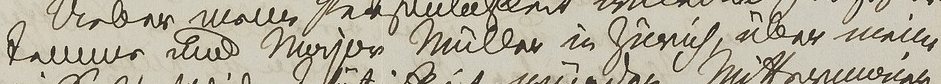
Temme und Major Müller in Zürich, über meine
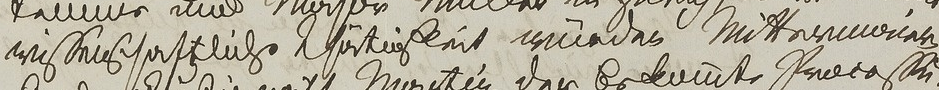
wissenschaftliche Thätigkeit würden Mittermaier
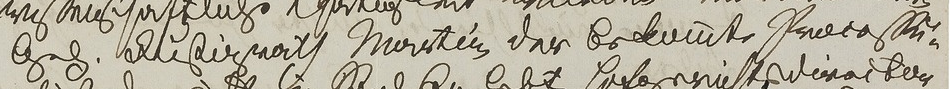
Geh. Justizrath Martin, der bekannte Proceßu-
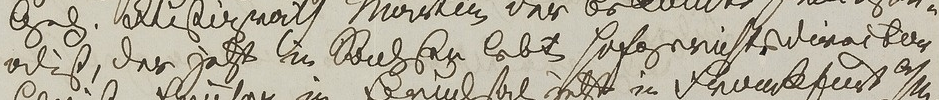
alist, der jetzt in Sachsen lebt, Hofgerichtsdirector
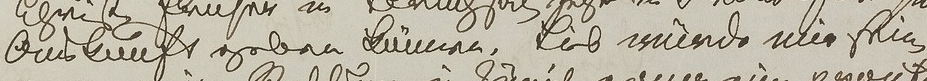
Auskunft geben können. Lieb würde mir sein,
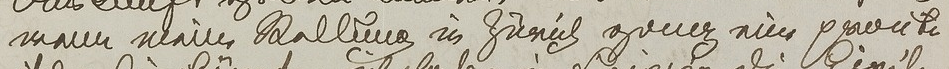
wenn meine Stellung in Zürich ganz eine pract-
